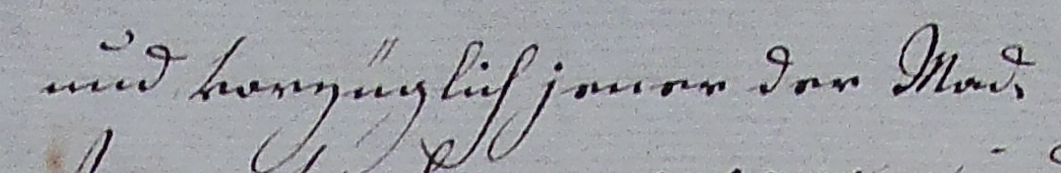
und vorzüglich jener der Mad.
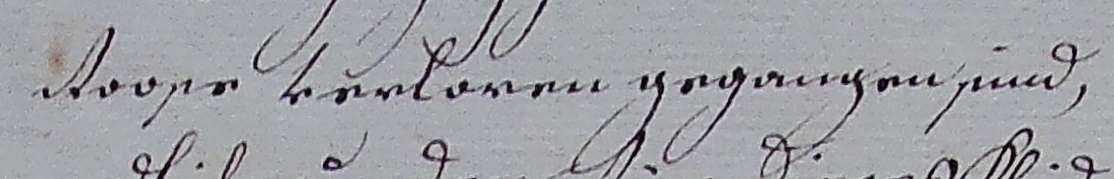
Roose verloren gegengaen sind,
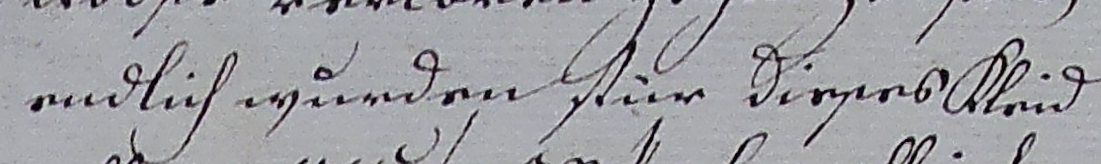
endlich wurden für dieses Kleid
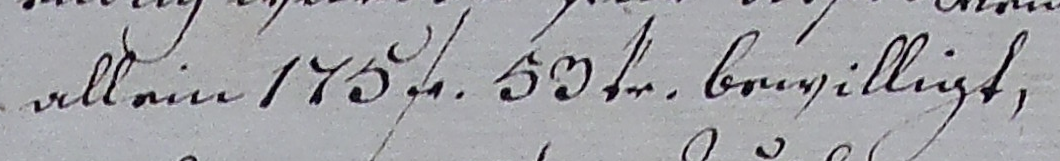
allein 175fr. 53kr. bewilligt,
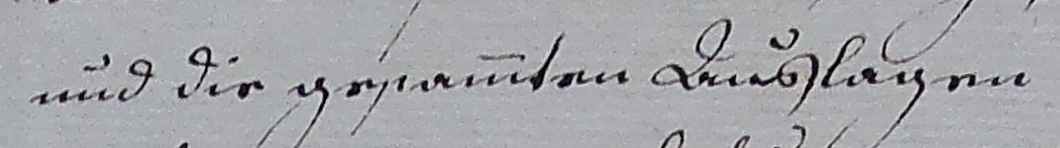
und die gesam̅ten Auslagen
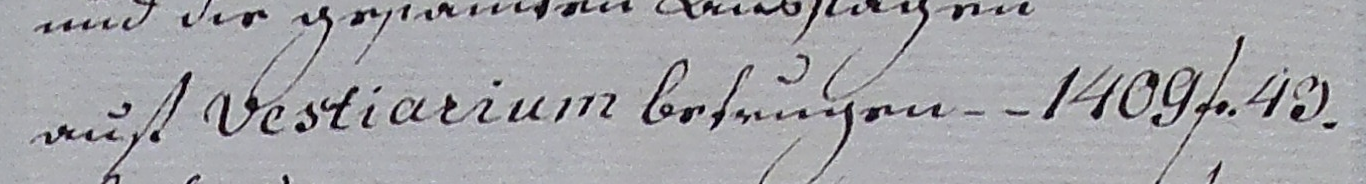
auf vestiarium betrugen _ _ 1409fr. 43.
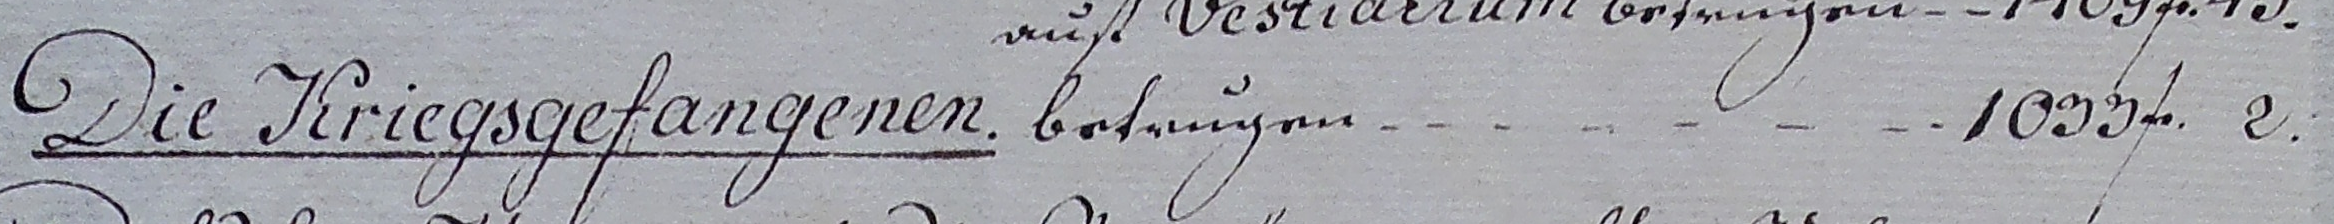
Die Kriegsgefangenen. betrugen .. .. .. .. .. .. .. 1033fr. 2.
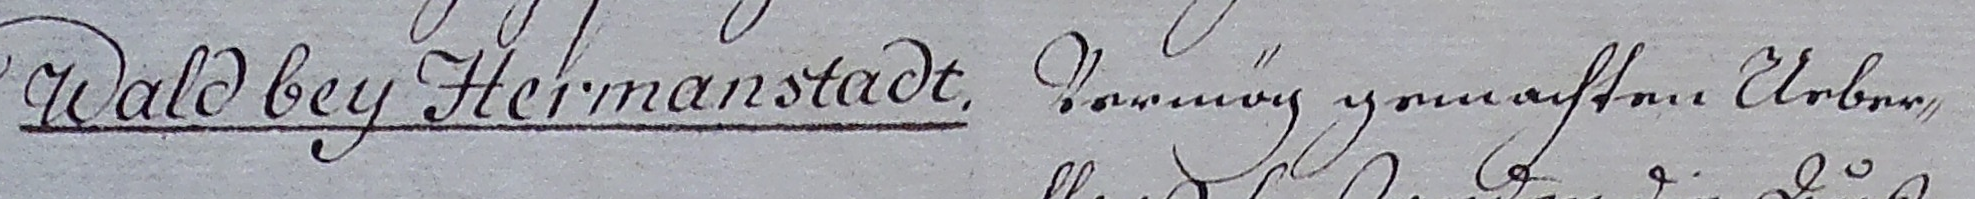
Wald bey Hermanstadt. Vermög gemachten Ueber¬
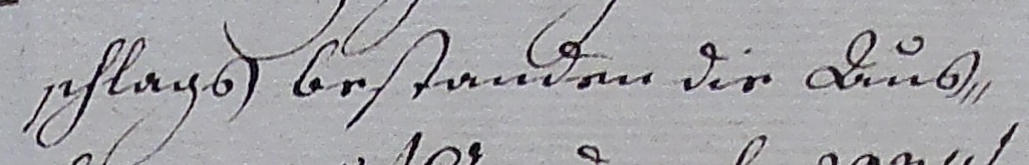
schlags bestanden die Aus¬
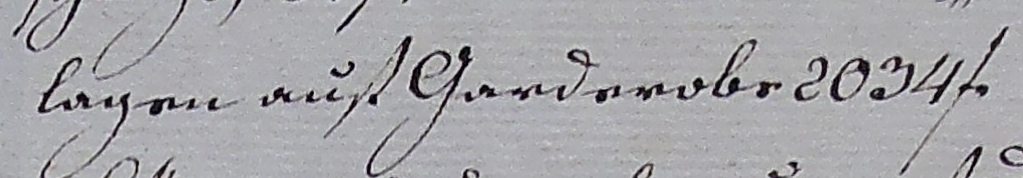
lagen auf Garderobe 2034fr.
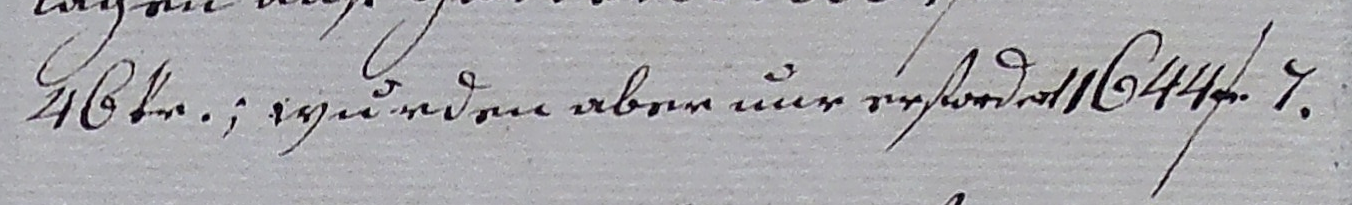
46kr.; wurden aber nur erfordert 1644fr. 7.
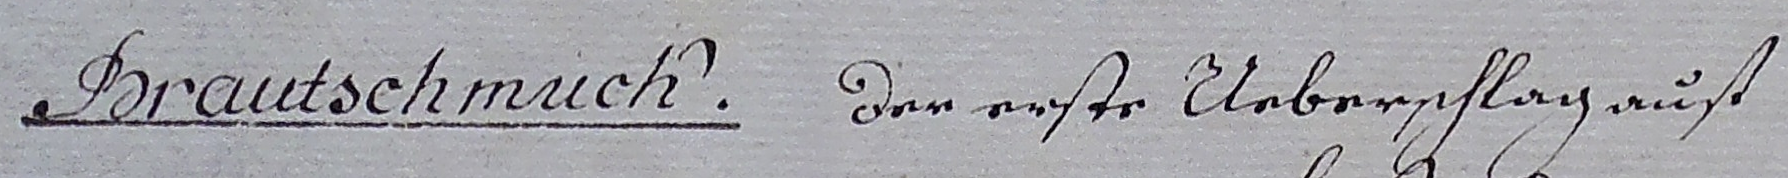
Brautschmuck. Der erste Ueberschlag auf
